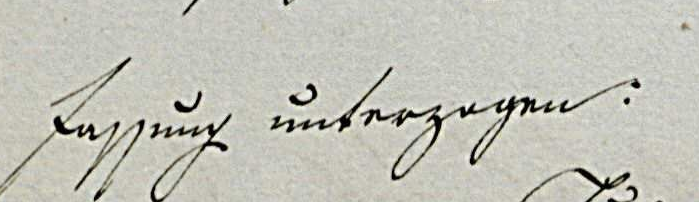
fassung unterzogen:
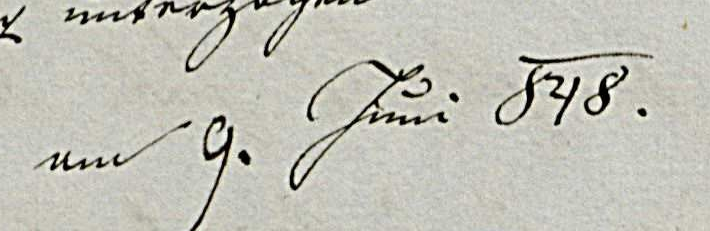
Am 9. Juni 848
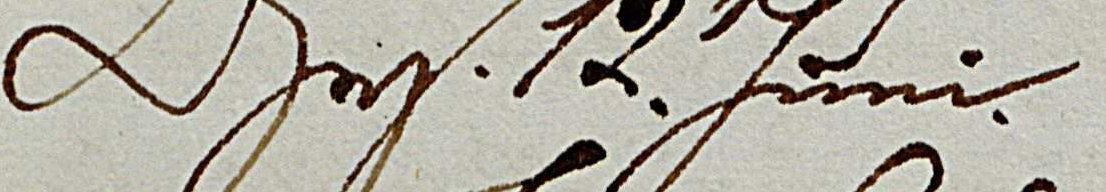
Ges. 12. Juni
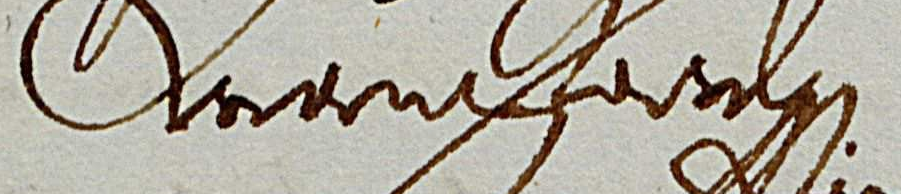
Franz Karl
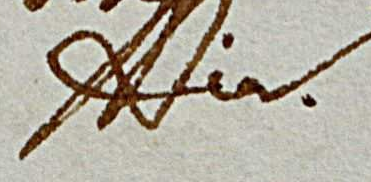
Min.
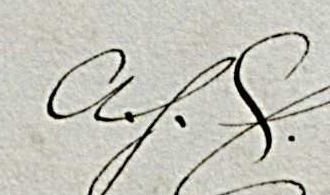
AhE.
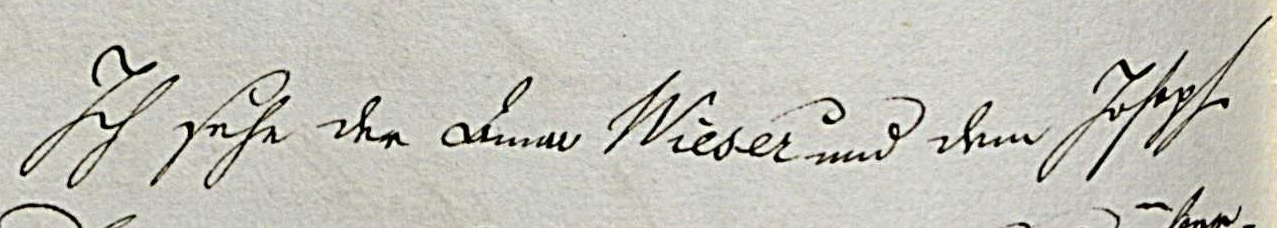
Ich sehe der Anna Wieser und dem Joseph
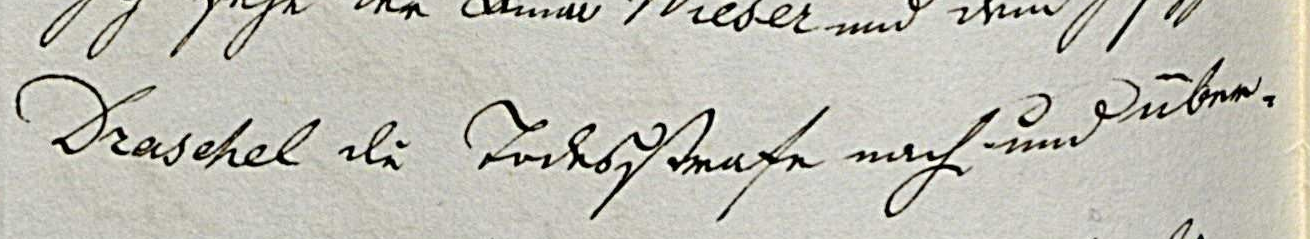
Draschel die Todesstrafe nach und über¬
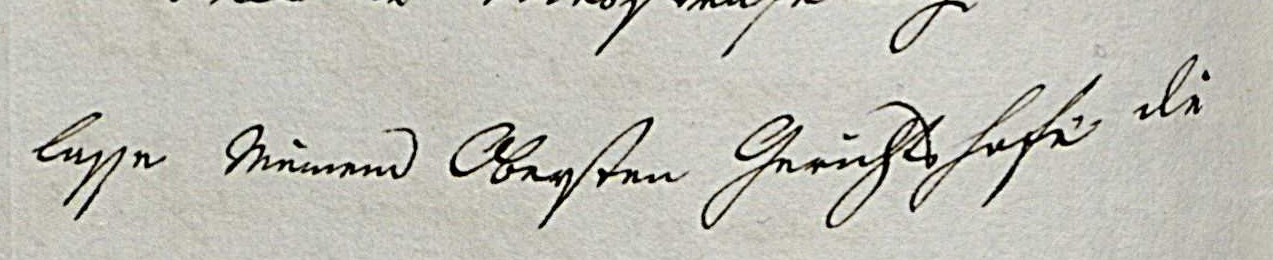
lasse Meinem Obersten Gerichtshofe die
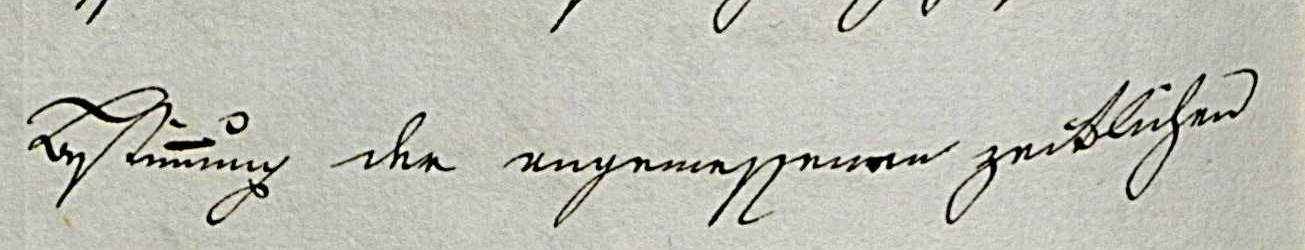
Bestimmung der angemessenen zeitlichen
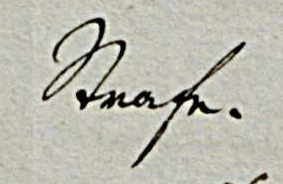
Strafe.
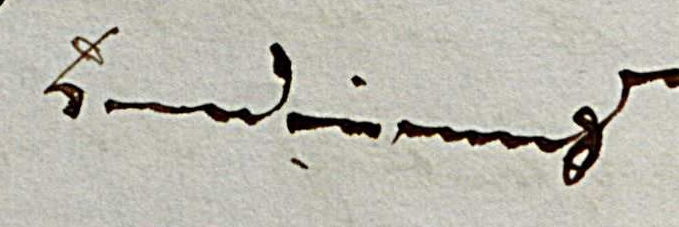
Ferdinand
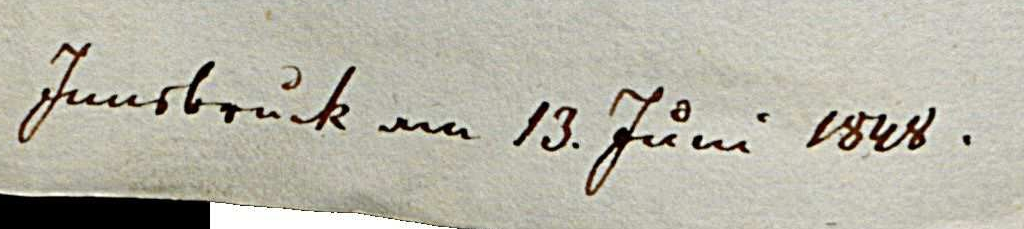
Innsbruck am 13. Juni 1848
